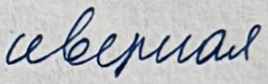северная
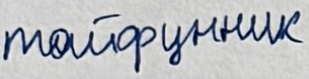тайфунник
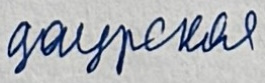даурская
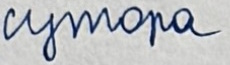сутора
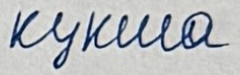кукша
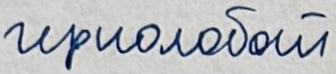чернолобай
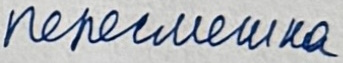пересмешка
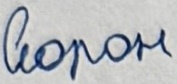ворон
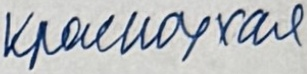красноухая
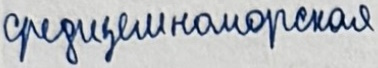средиземноморская
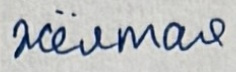жёлтая
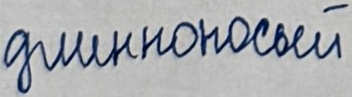длинноносый
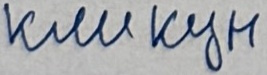кликун
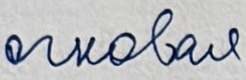очковая
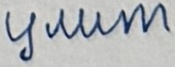улит
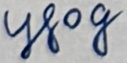удод
